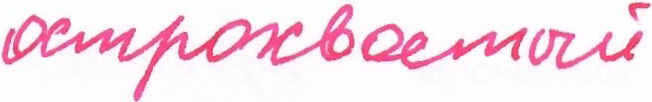острохвостый
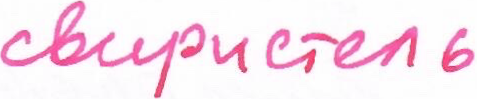свиристель
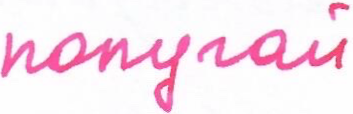попугай
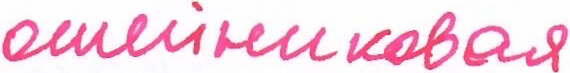ошейниковая
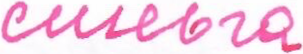синьга
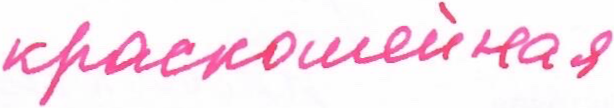красношейная
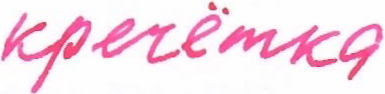кречётка
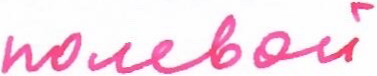полевой
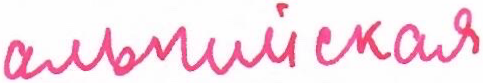альпийская
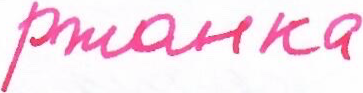ржанка
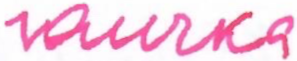гаичка
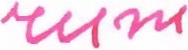чиж
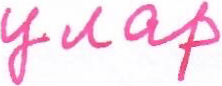улар
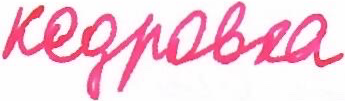кедровка
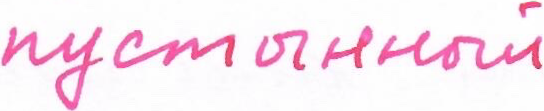пустынный
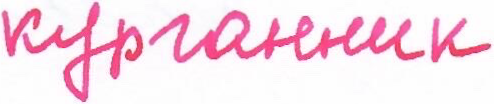курганник
